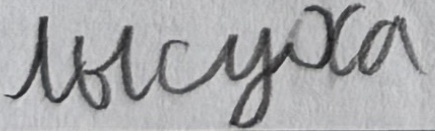лысуха
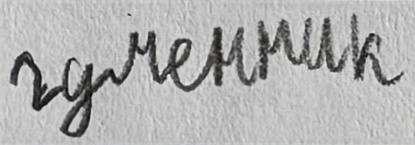гуменник
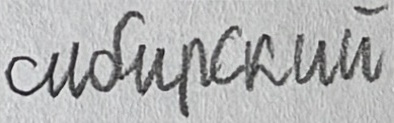сибирский
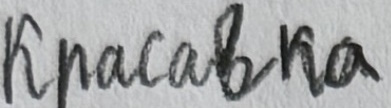красавка
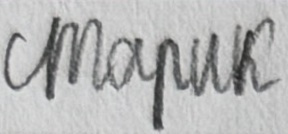старик
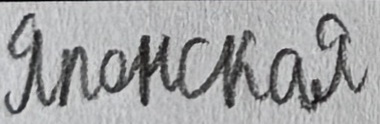японская
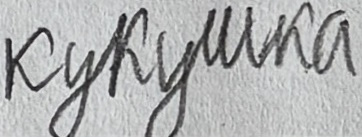кукушка
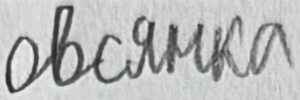овсянка
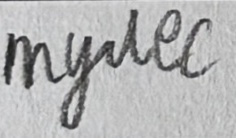тулес
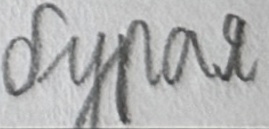бурая
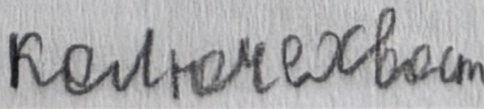колючехвост
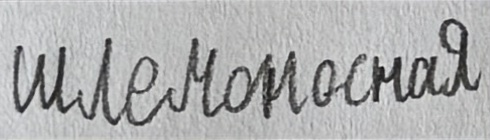шлемоносная
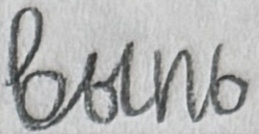выпь
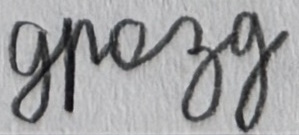дрозд
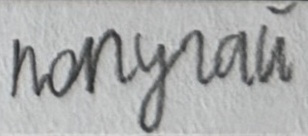попугай
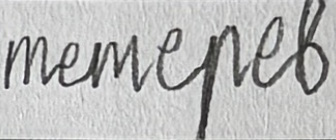тетерев
